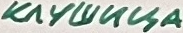клушица
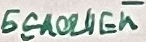белошей
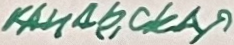канадская
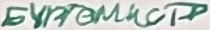бургомистр
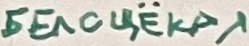белощёкая
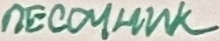песочник
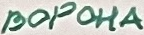ворона
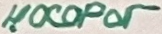носорог
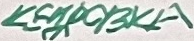кедровка
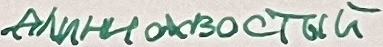длиннохвостый
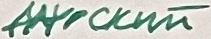даурский
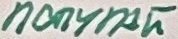попугай
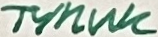тупик
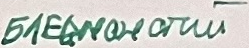бледноногий
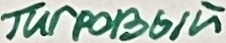тигровый
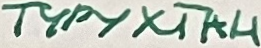турухтан
